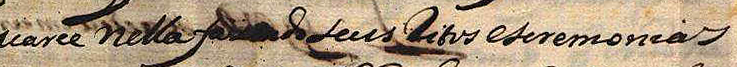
uarce nella fa_do seus Ritos e seremonias
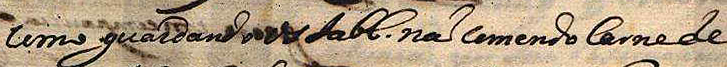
como guardando os sabb. nā comendo Carne de
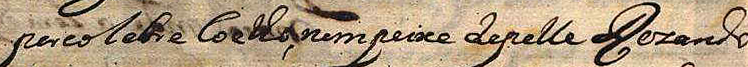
porco lebre Coelho, nem peixe de pelle Rezando
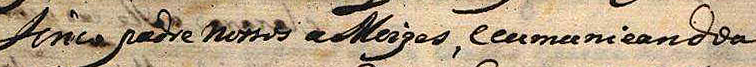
Sinco padre nossos a Moizes, e cumunicandoa
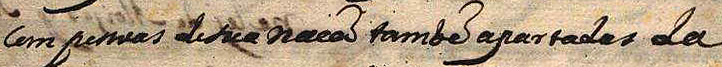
com pessoas de sua nacā tambē apartadas da
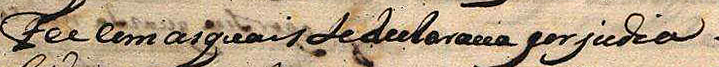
Fee com as quais se declaraua por judia.
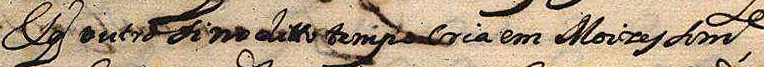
& q̄ outrosi no ditto tempo cria em Moizes somte,
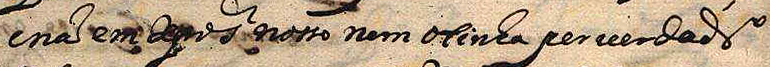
e nā em xpo sor nosso nem o tinha per uerdadro
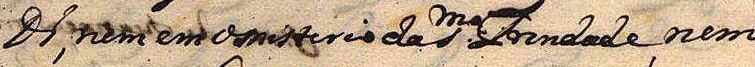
Ds̄, nem em o misterio da sma. Trindade, nem
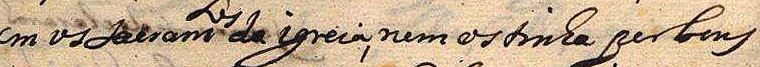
em os Sacramtos da igreia, nem os tinha per bons
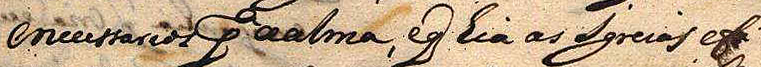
e necessarios pa a alma, e q̄ hia as Igreias e fa
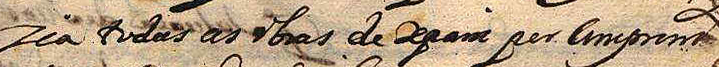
zia todas as obras de xpam per comprimto
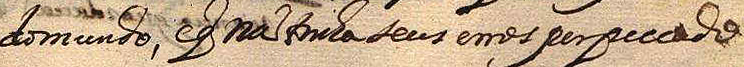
do mundo, e q̄ nā tinha seus erros per peccado
